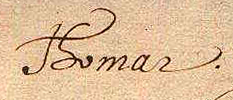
Thomar.
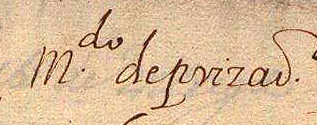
M.do de prizaõ.
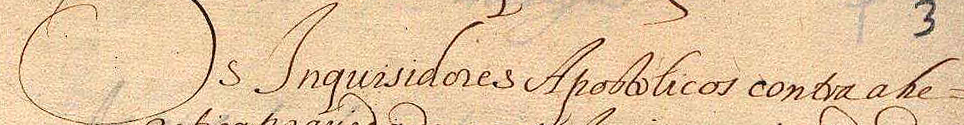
Os Inquisidores Apostolicos contra a he
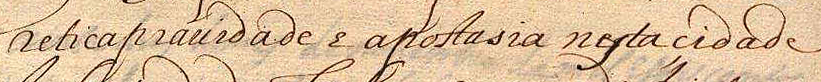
retica prauidade E apostasia nesta cidade
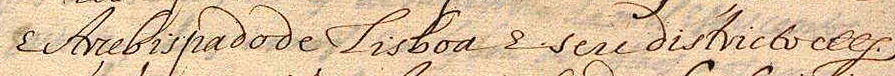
E Arcebispado de Lisboa E seu districto ettꝭ.
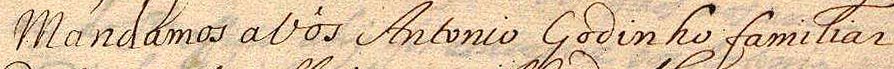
Mandamos a vós Antonio Godinho familiar
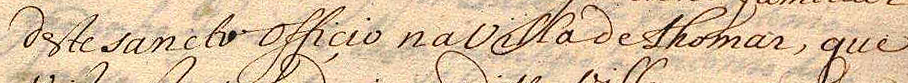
deste sancto officio na villa de thomar, que
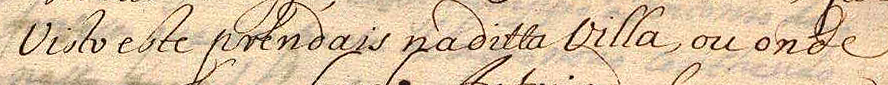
Visto este prendais na ditta Villa, ou onde
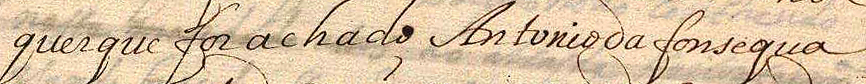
quer que for achado Antonio da fonsequa
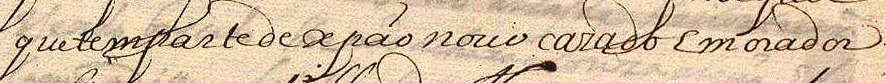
que tem parte de xpaõ nouo cazado E morador
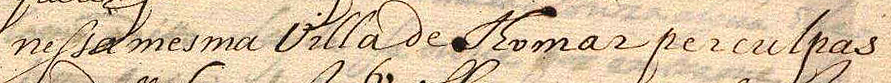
nessa mesma Villa de Thomar per culpas
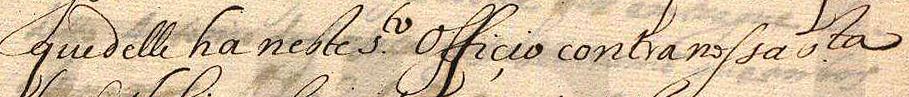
que delle ha neste s.to officio contra nossa s.ta
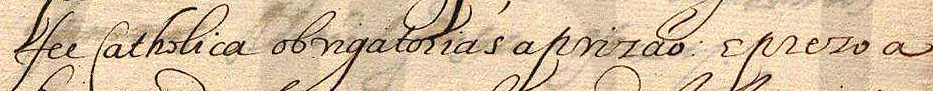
fee Catholica obrigatorias a prizaõ: E prezo a
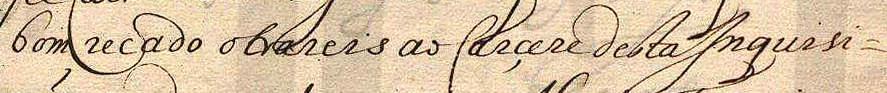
bom recado o trareis ao Carcere desta Jnquisi
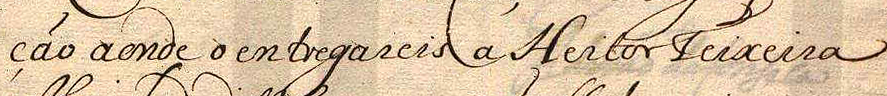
ção aonde o entregareis a Heitor Teixeira
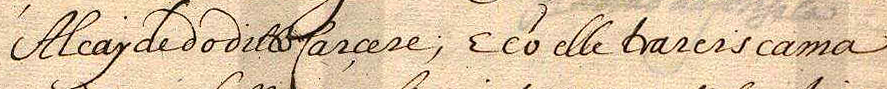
Alcayde do ditto Carcere, E cō elle trareis cama
